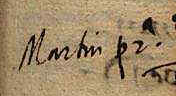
Martim pra.
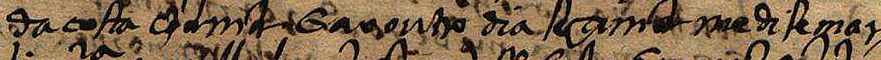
da costa cōtemte E ao outro dia segimte me dise mar
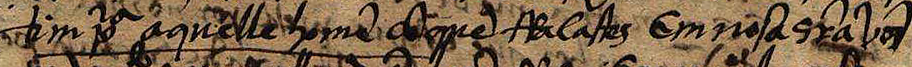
tim pra aquelle homē cō quē ffalastes Em nosa Sr̄a Vos
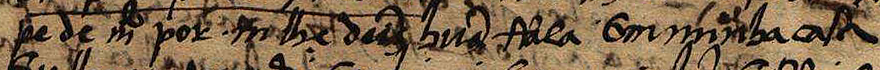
pede mto por .m. lhe deis huā ffala Em minha casa
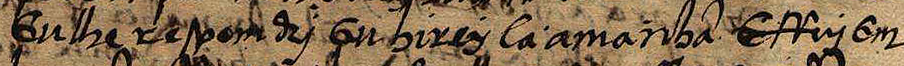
Eu lhe respondy Eu hirey la amanhã E ffuj Em
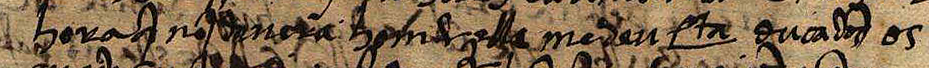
hora q̄ nō deuera homde elle me deu Lta ducados os
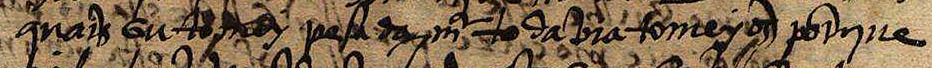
quais Eu tomey pesadamte todavia tomeyos porque
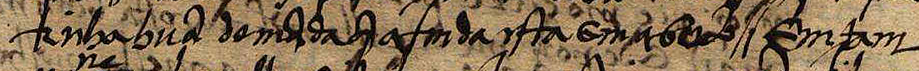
tinha huā demāda q̄ aJmda esta Em aberto // Emtam
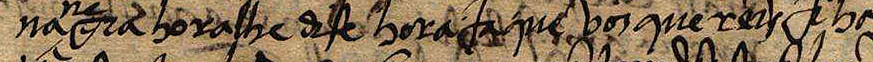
na negra hora lhe dise hora Ja que vos quereis Jr ha
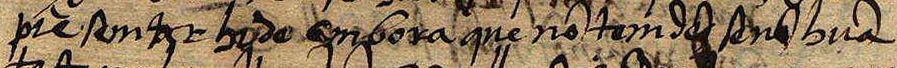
presemtar hide Embora que nō temdes senā huā
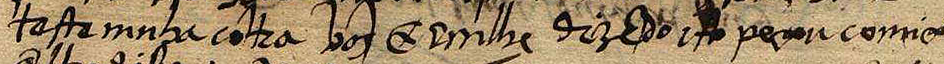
testemuha cōtra vos E Em lhe dizēdo isto pegou comigo
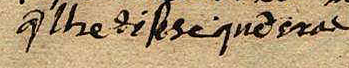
q̄ lhe disese quē Era
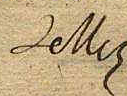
tellez
